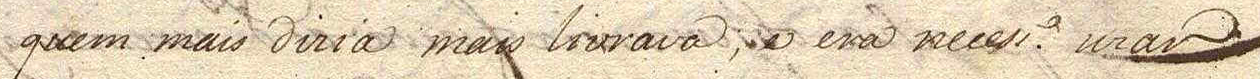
quem mais dizia mais livrava, e era necess.o uzar
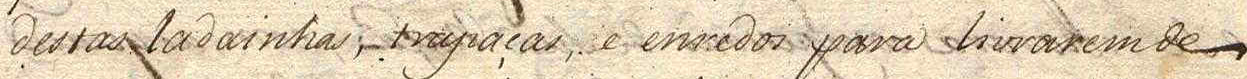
destas ladainhas, trapaças, e enredos para livrarem de
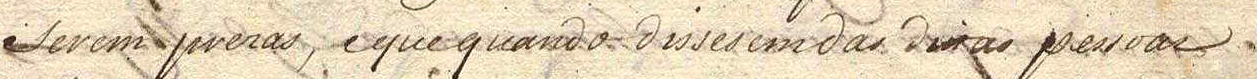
serem prezas, e que quando dissesem das ditas pessoas
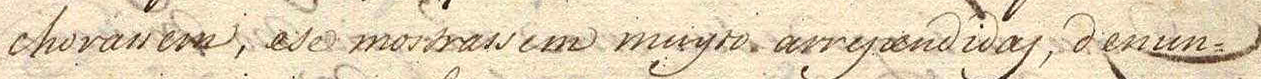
chorassem, e se mostrassem muyto arrependidas, denun
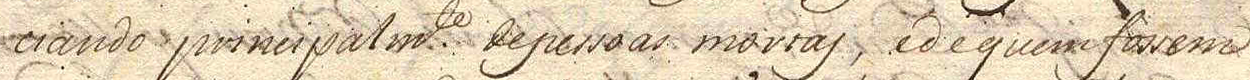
ciando principalm.te de pessoas mortas, e de quem fossem
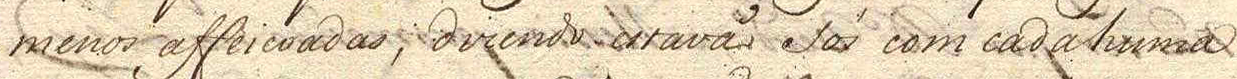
menos affeicoadas, dizendo estavaõ sós com cada huma
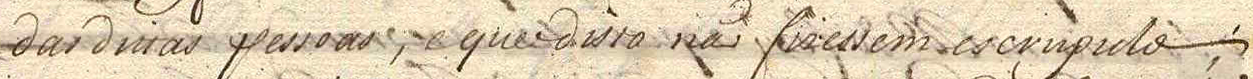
das ditas pessoas, e que disto não fizessem escrupulo,
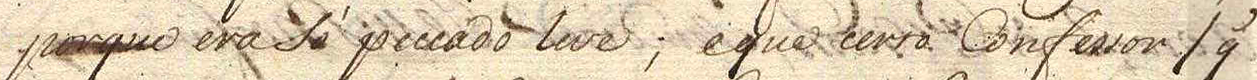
porque era Só peccado leve; e que certo Confessor / q̄
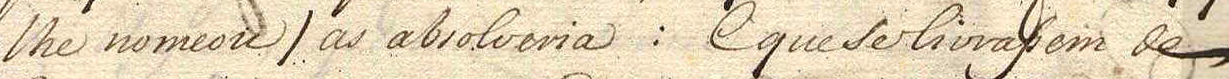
lhe nomeou / as absolveria: E que se livrassem de
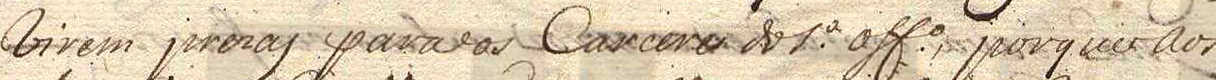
virem prezas para os Carceres do S.o off.o, porque aos
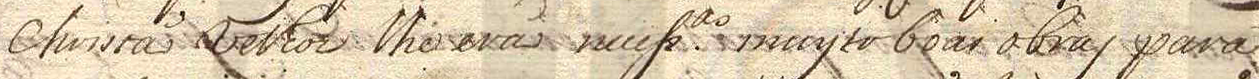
christaõ velhos lhe erão necess.as muyto boas obras para
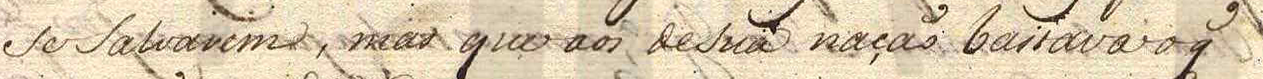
se salvarem, mas que aos de sua naçaõ bastava o q̄
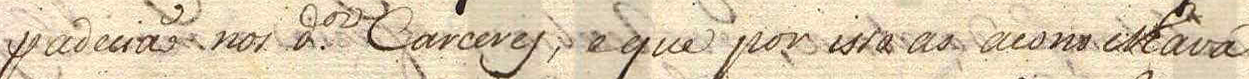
padeciaõ nos d.os Carceres, e que por isto os aconselhava
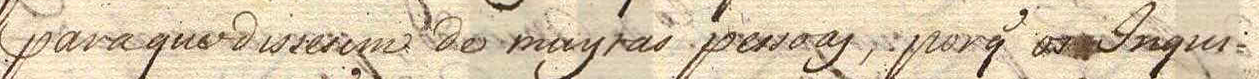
para que dissesem de muytas pessoas, porq̄ os Inqui
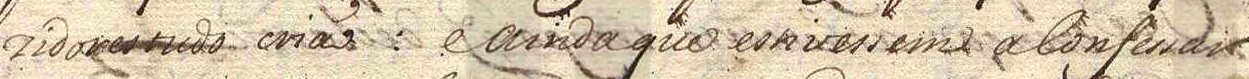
zidores tudo crião: e ainda que estivessem a Confessar
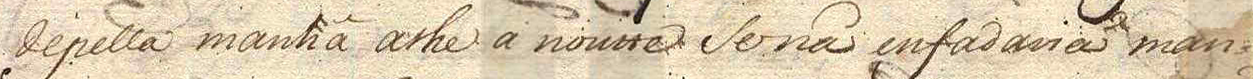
de pella manha athe a noutte se não enfadavaõ man
